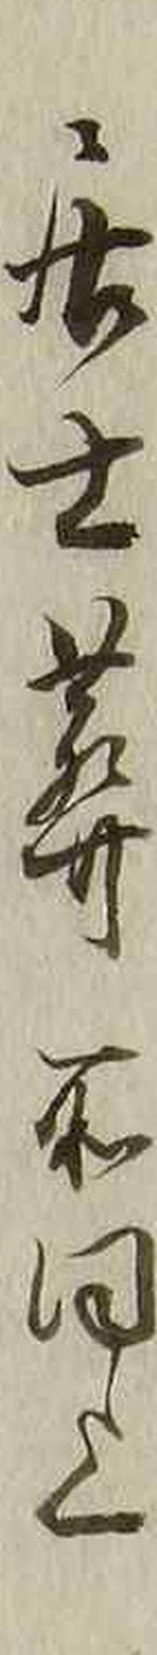居士葬所同上
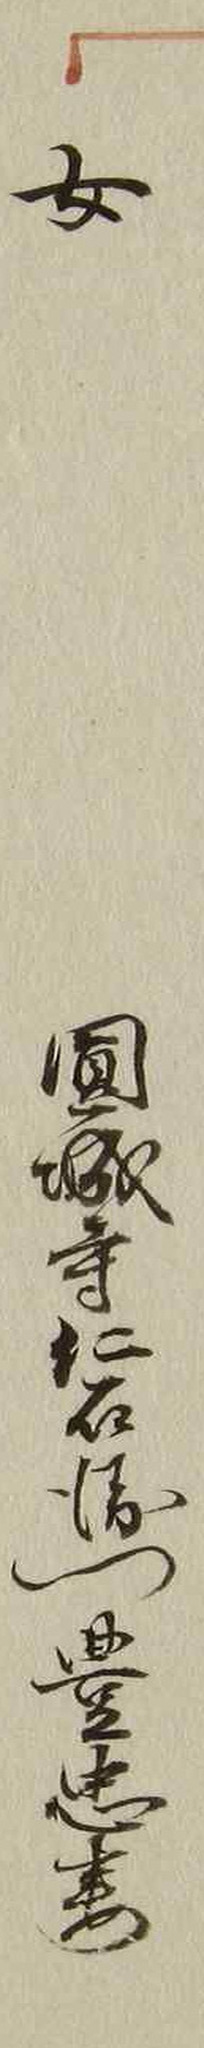女円城寺仁石衛門豊忠妻
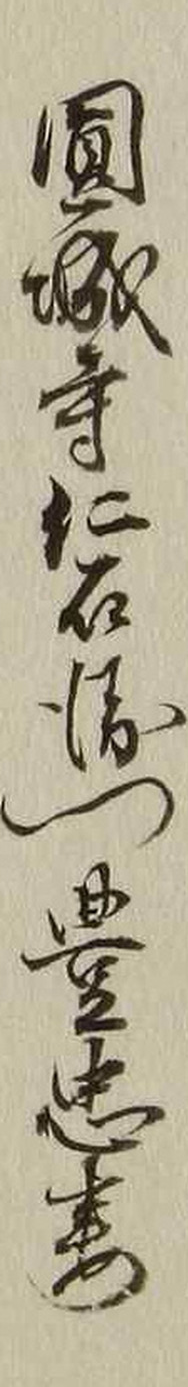女円城寺仁石衛門豊忠妻
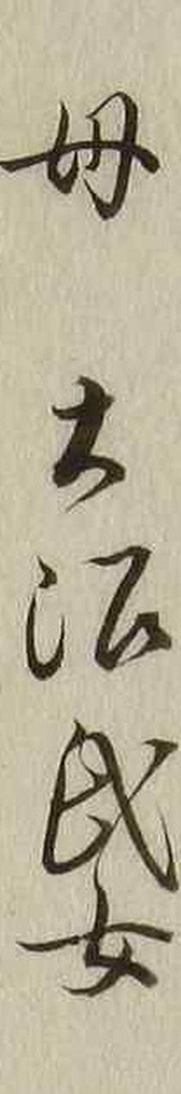母大沼氏女
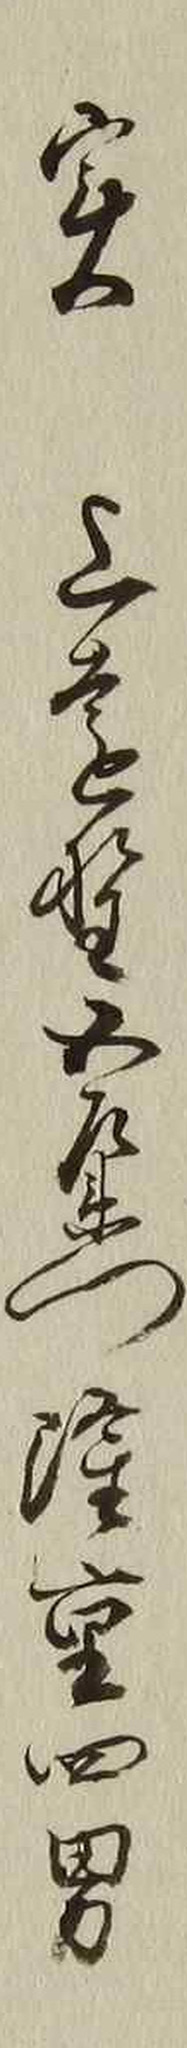実上遠野五左衛門隆重四男
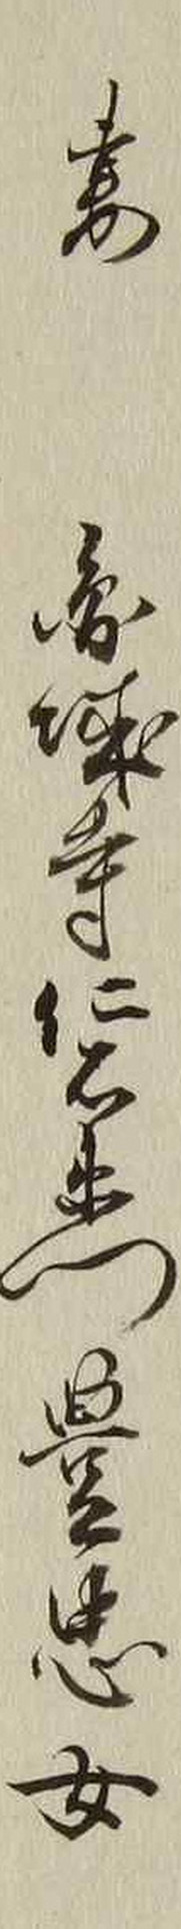妻円城寺仁右衛門豊忠女
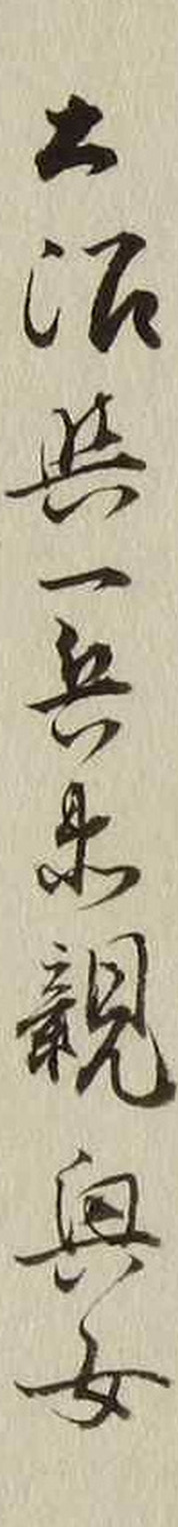大沼与一衛親興女
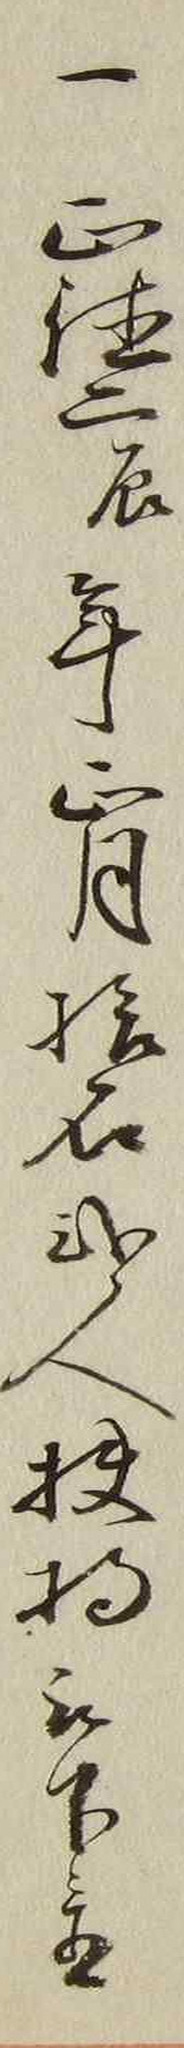一正徳二辰年正月拾石弐人扶持被下置
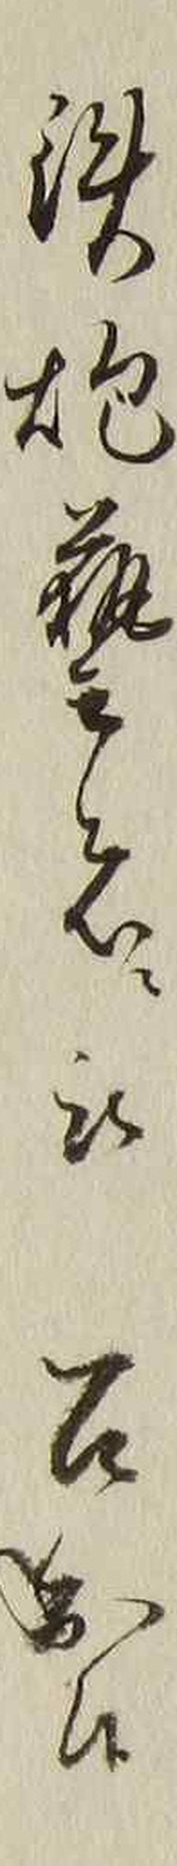鉄炮芸者ニ被召出候
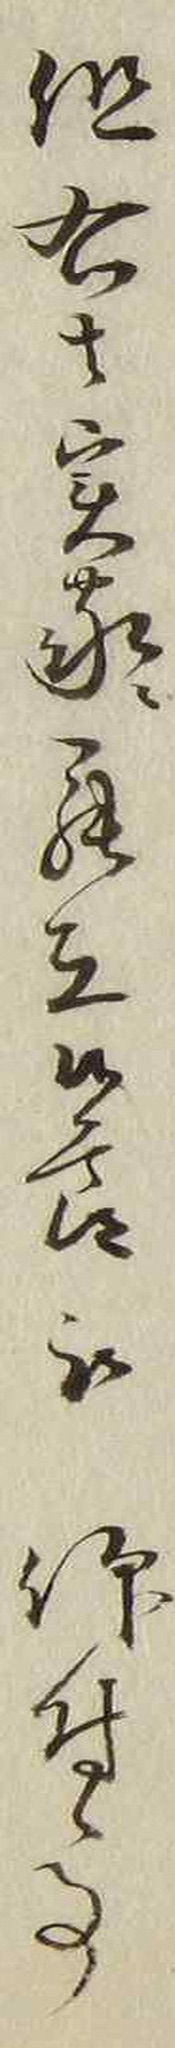但右者実家ニ罷在候節被仰付候事
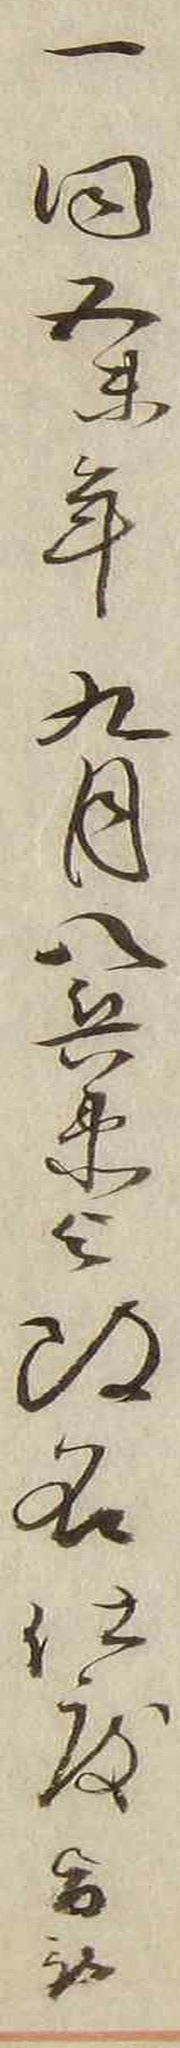一同五未年九月八兵衛与改名仕度旨被

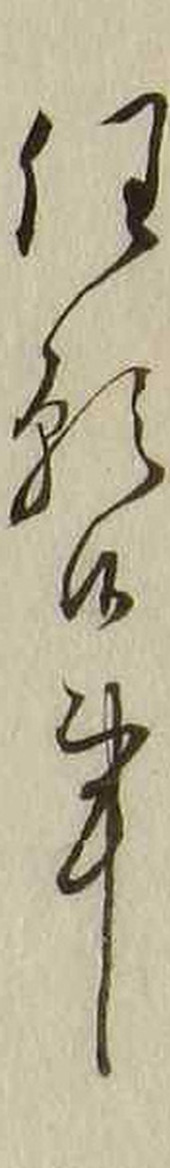任願候事
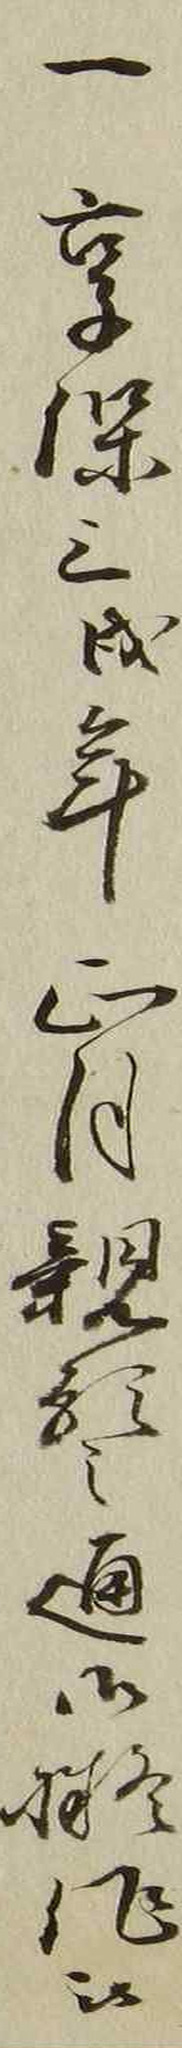一享保三戌年正月親願之通御擬作被
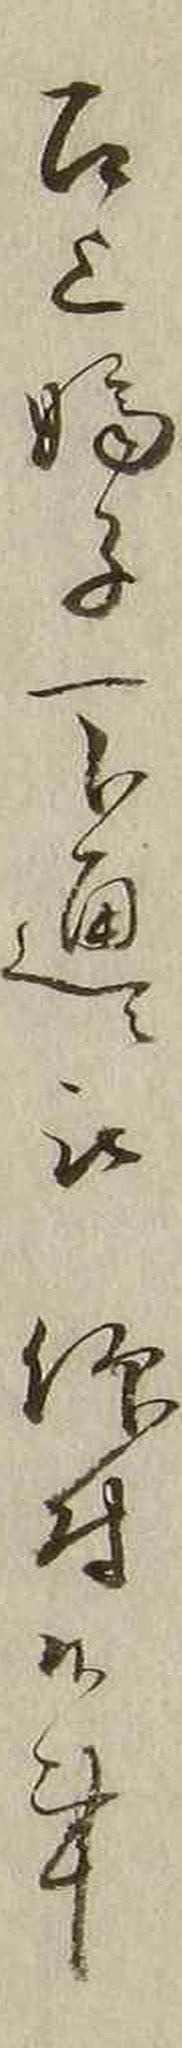召上嫡子一ト通ニ被仰付候事
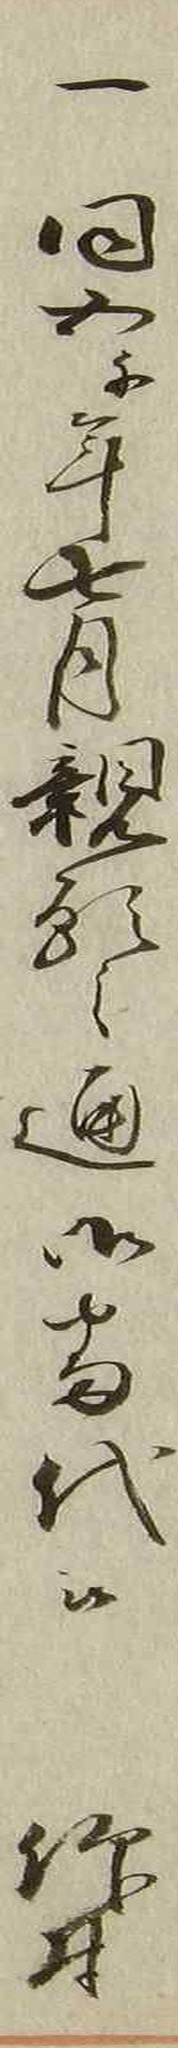一同五子年七月親願之通御番代被仰付
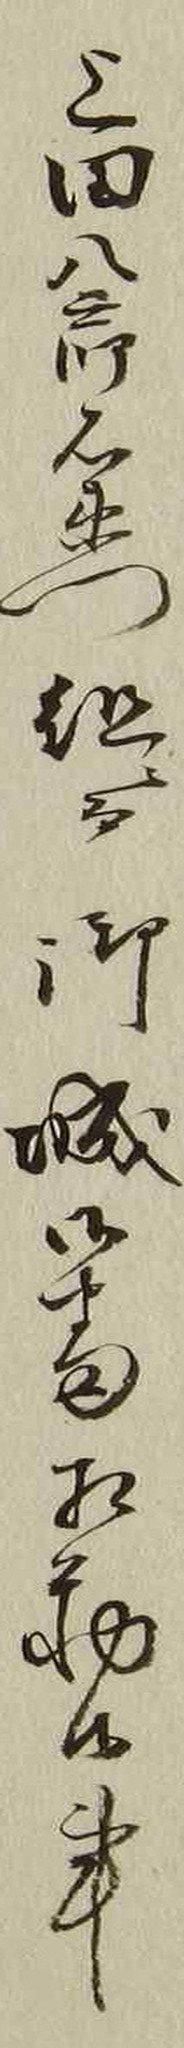上田八郎右衛門組ニ而御城御番相勤候事
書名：諸士系譜　巻之122　よ之部5
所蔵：会津若松市立会津図書館
